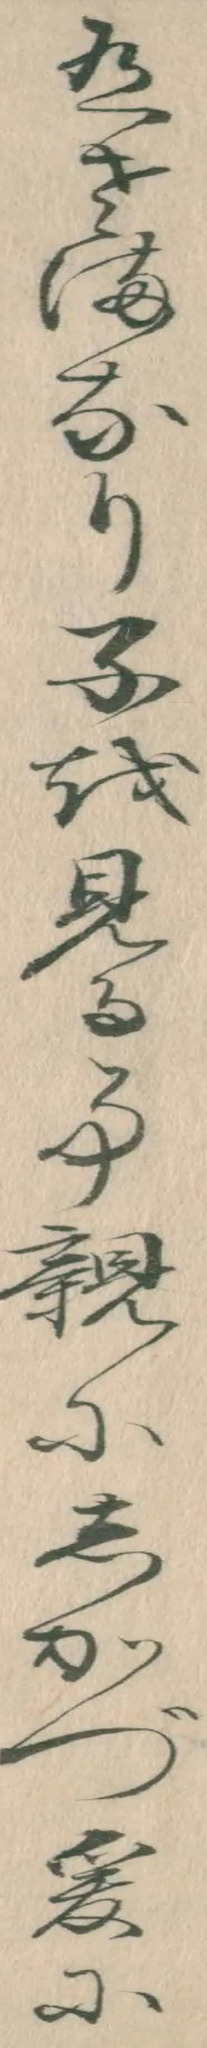有さまなり子を見る事親にしかづ爰に
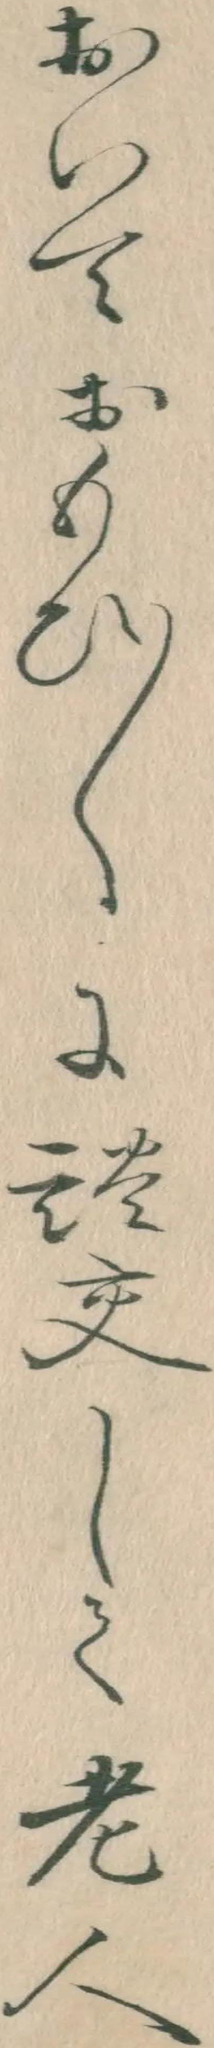おいておもひ〳〵に談交して老人
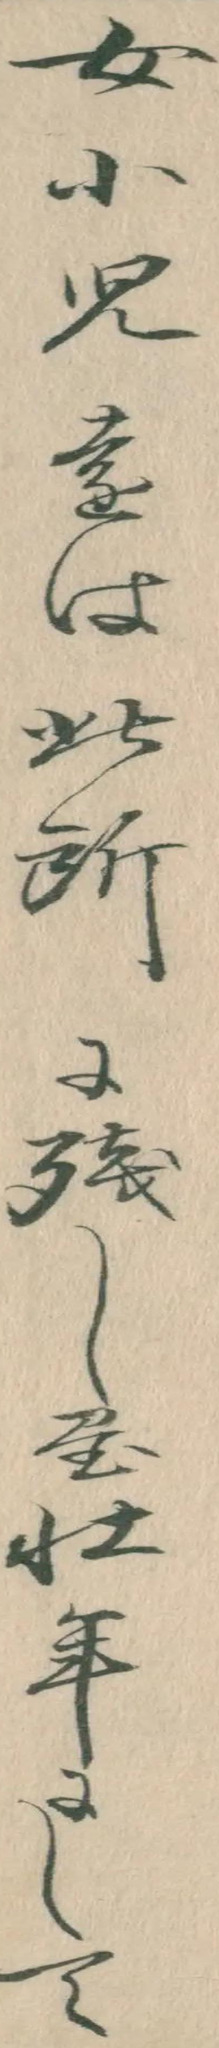女小児をは此所に残し置壮年にして

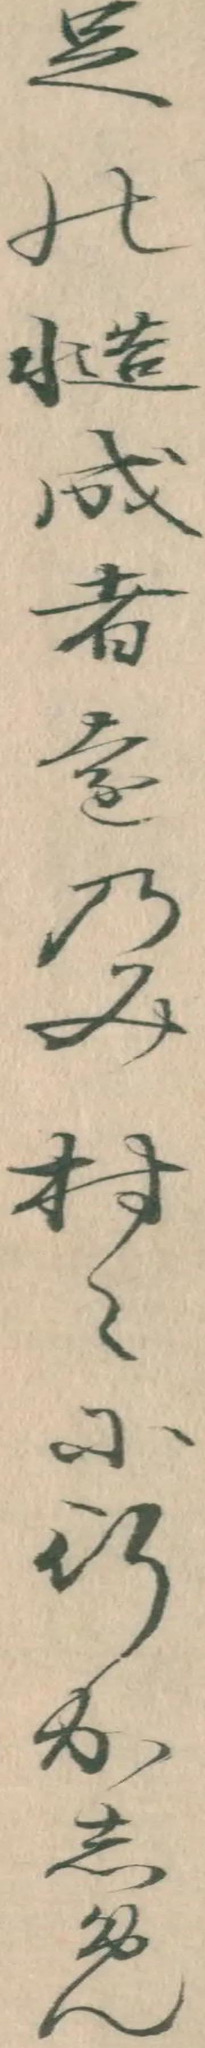足の慥成者をのみ村〻に行かしめ
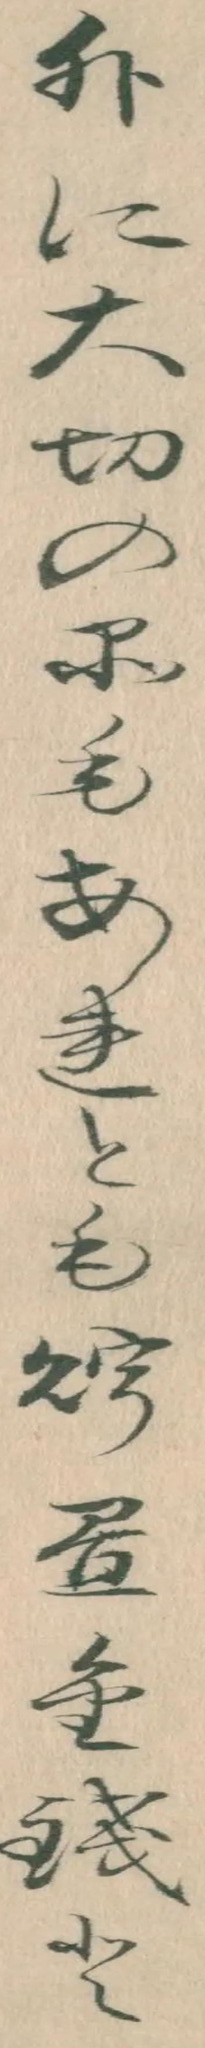外に大切の品もあれとも貯置金銭と
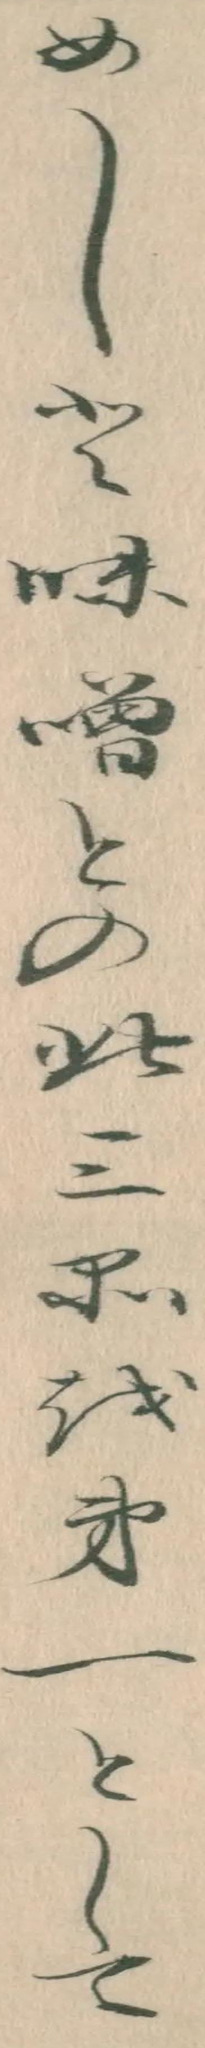めしと味噌との此三品を第一として
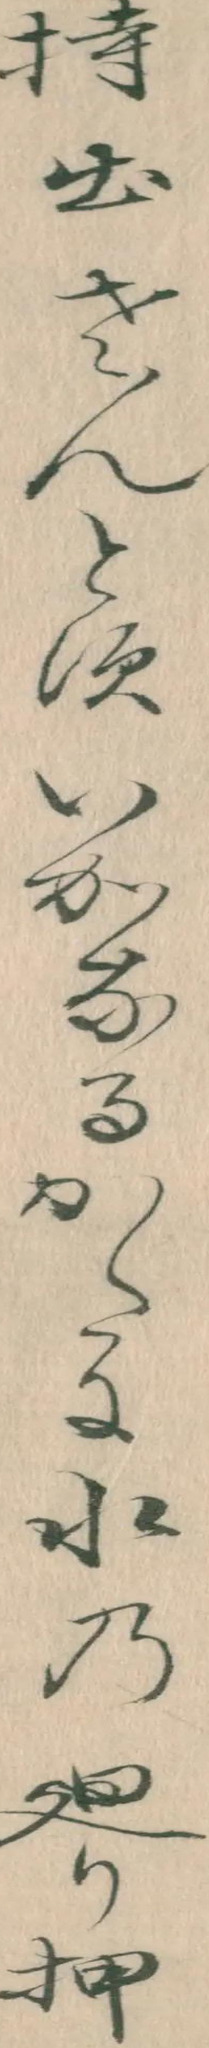持出さんとすいかなるかたに水の廻り押
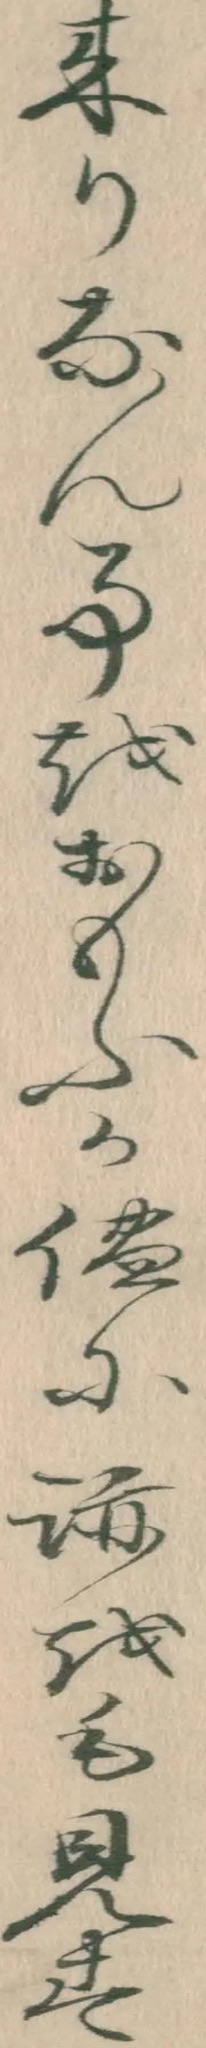来りなん事をおもふか侭に跡をも見す
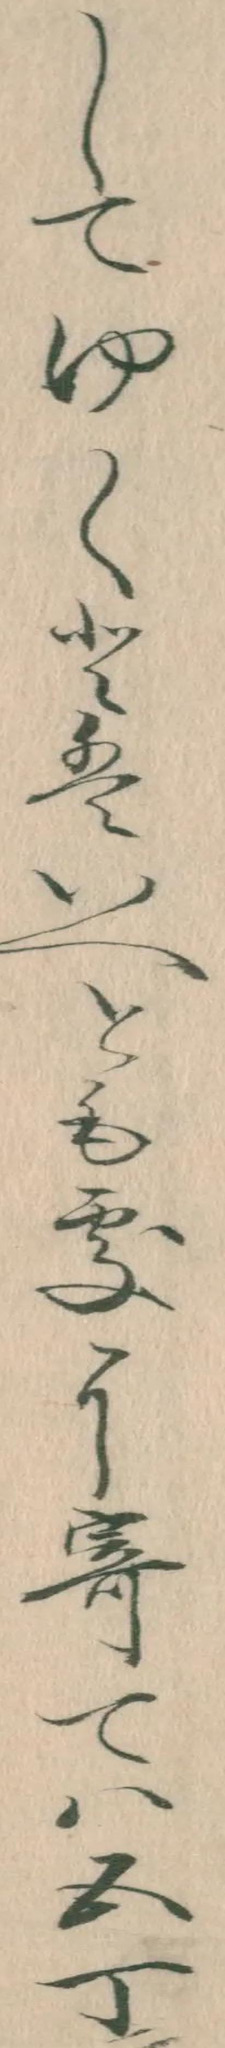してゆくとはいへとも処に寄ては五丁
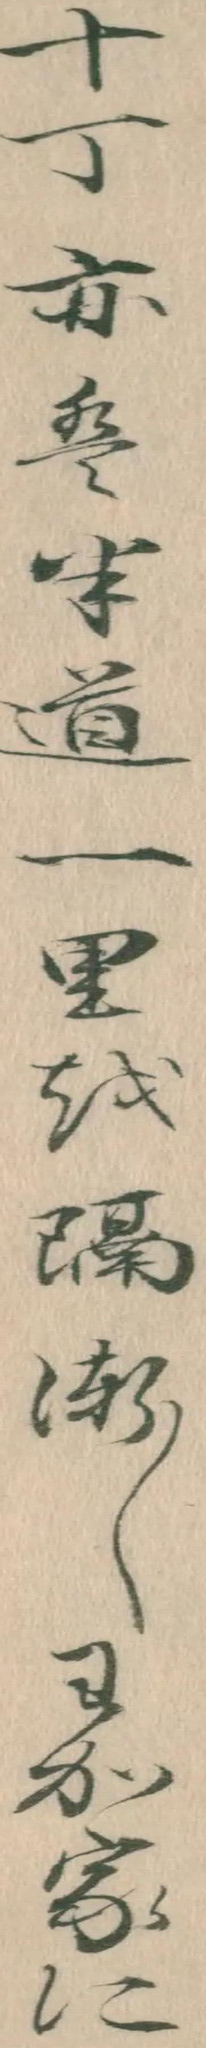十丁亦は半道一里を隔漸〳〵わか家に
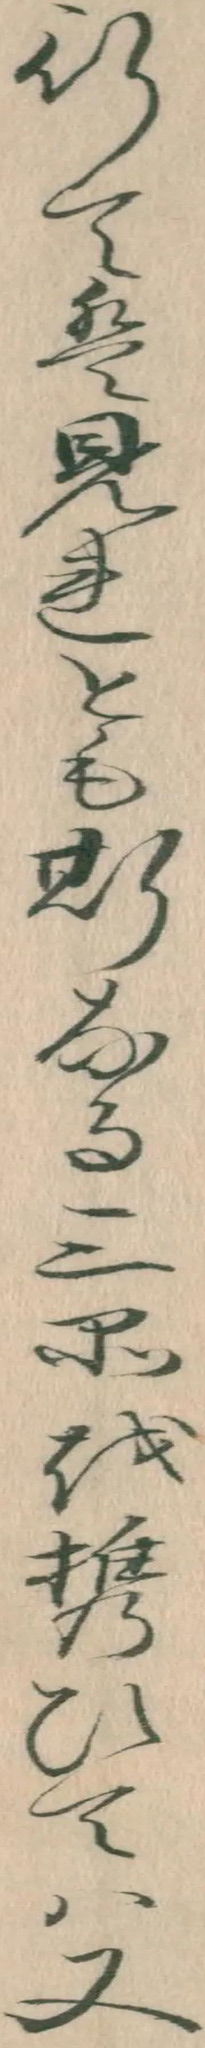行ては見れとも斯なる三品を携ひては又
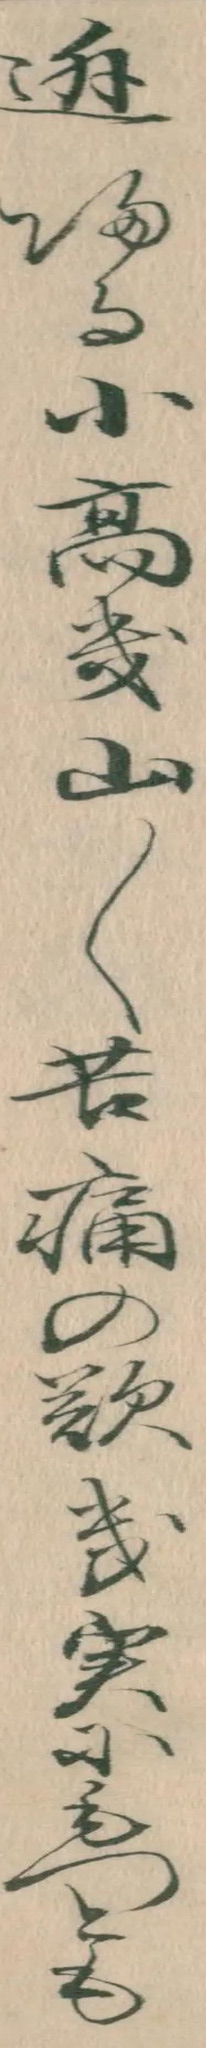逃帰る小高き山〳〵苦痛の歎き実にもつとも
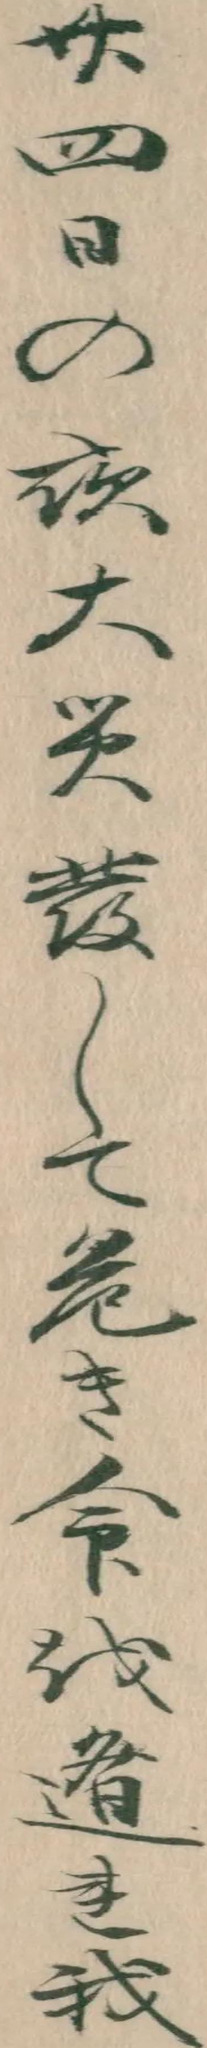廿四日の夜大災発して危き命を遁れ我
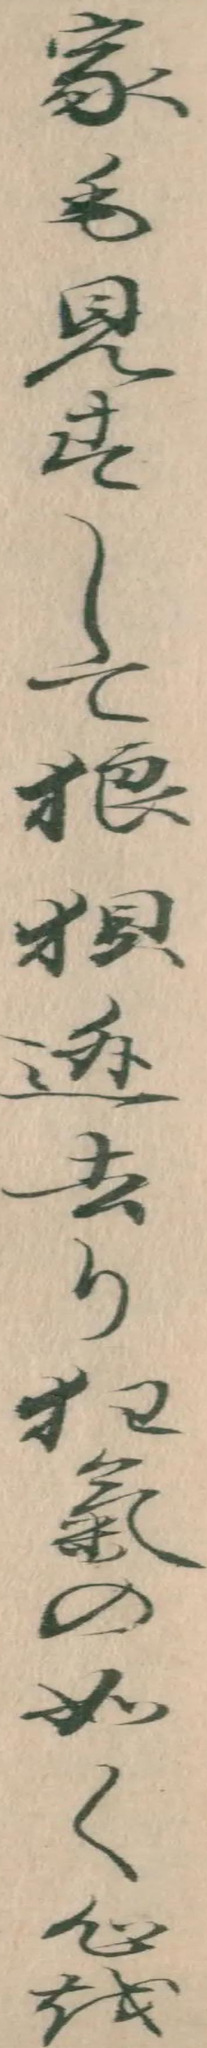家も見すして狼狽逃去り狂気の如く心を
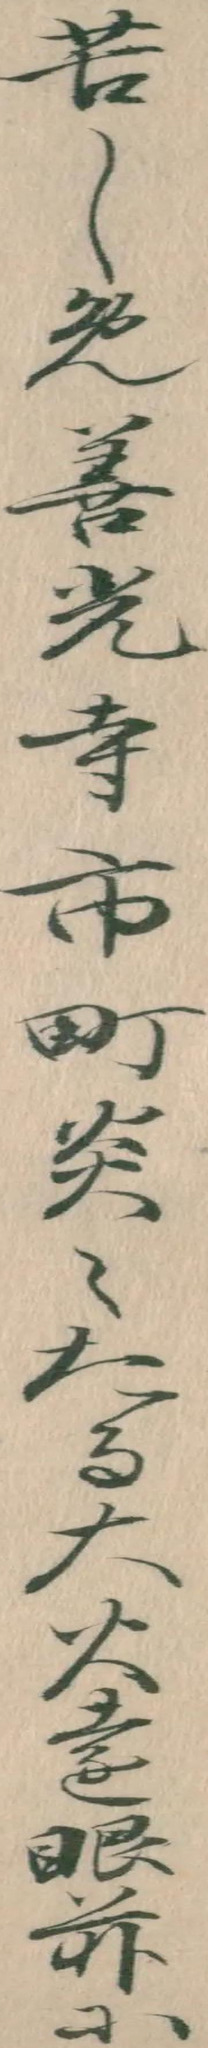苦しめ善光寺市町炎〻たる大火を眼前に
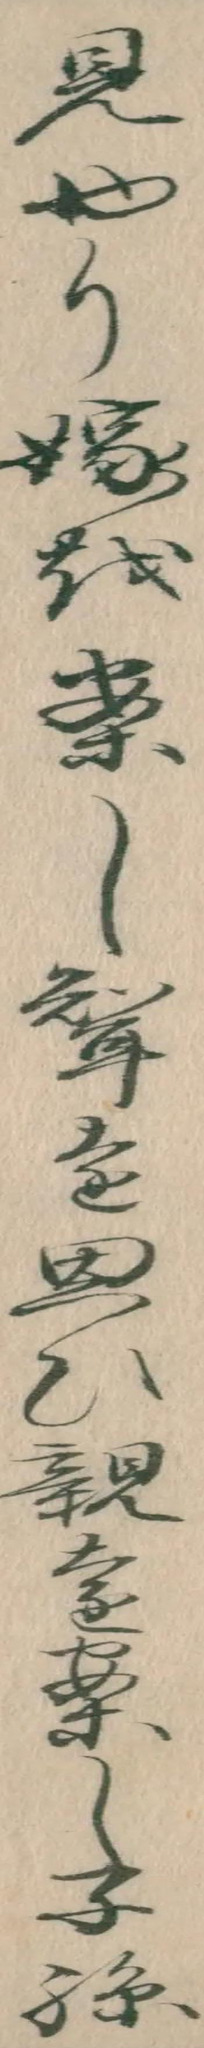見やり嫁を案し聟を思ひ親を案し子孫
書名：俗語之種. [6]
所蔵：国立国会図書館 National Diet Library, JAPAN
